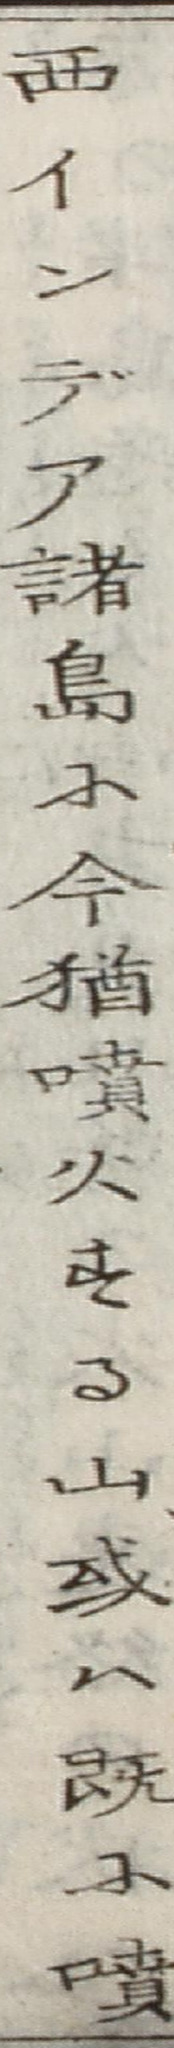西インデア諸島に今猶噴火する山、或は既に噴
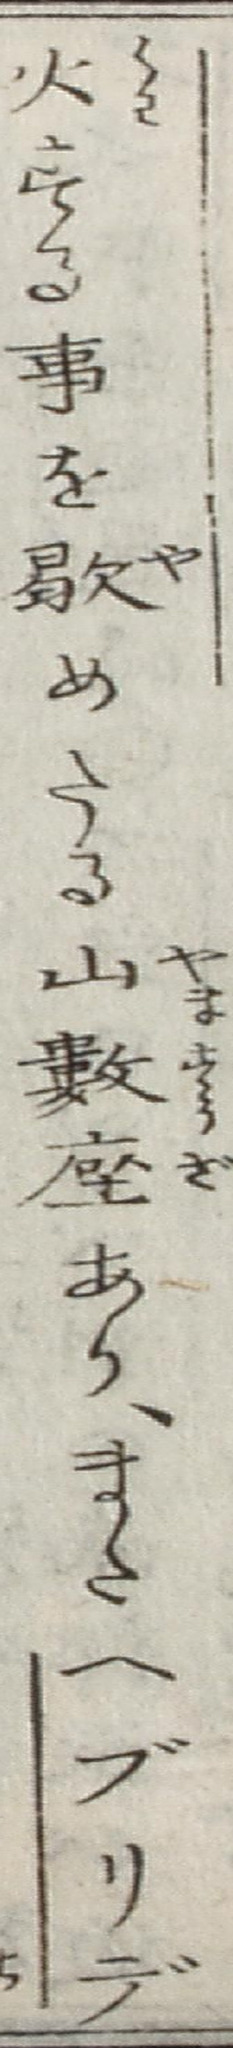火する事を歇めたる山数座あり、またヘブリデ
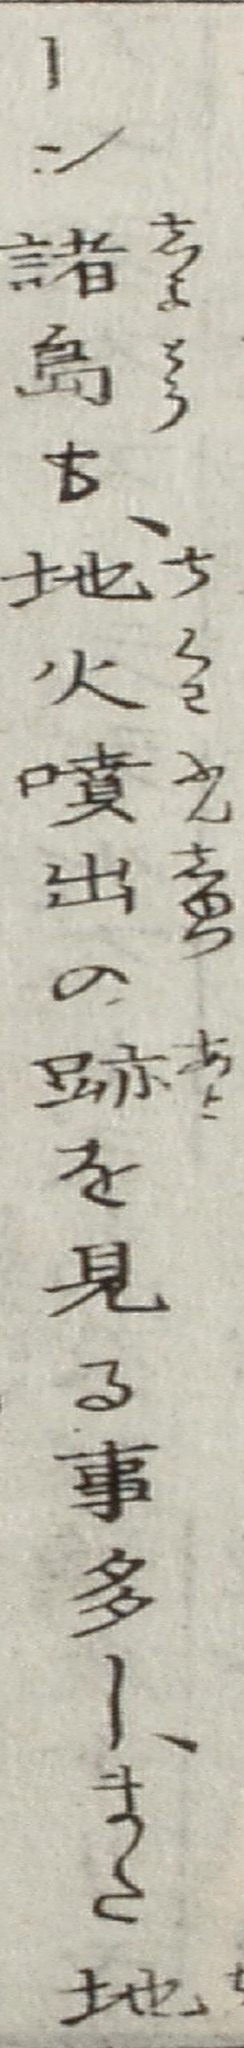ーン諸島も、地火噴出の跡を見る事多し、また地
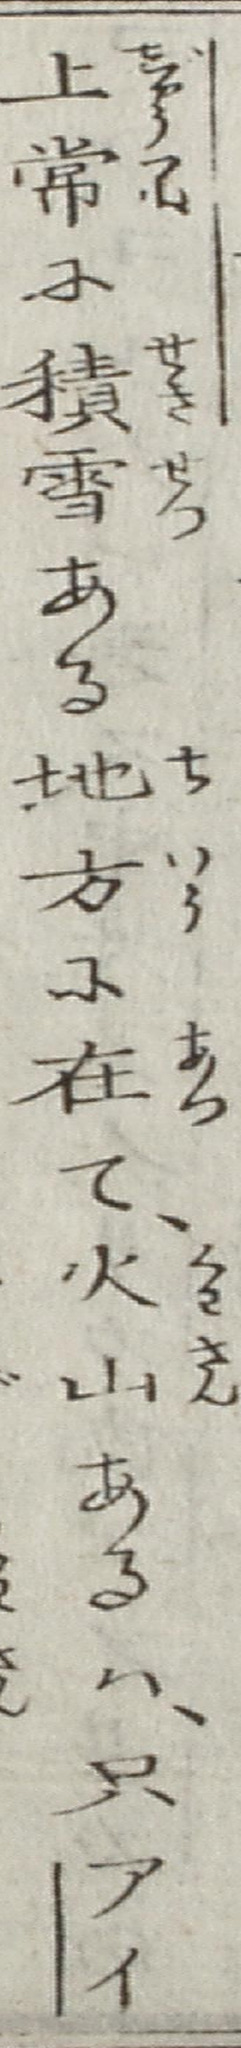上常に積雪ある地方に在て、火山あるは、只アイ
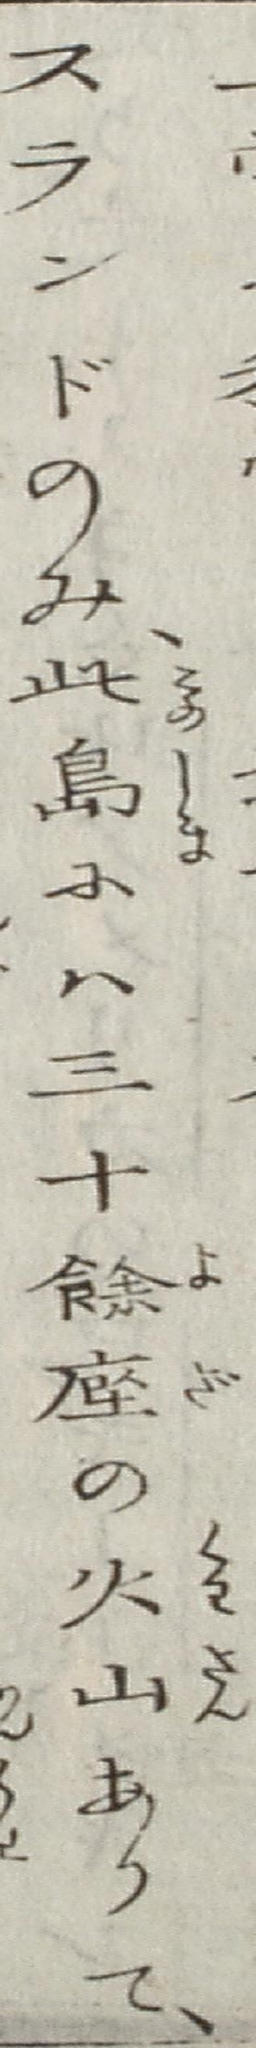スランドのみ、此島には三十余座の火山ありて、
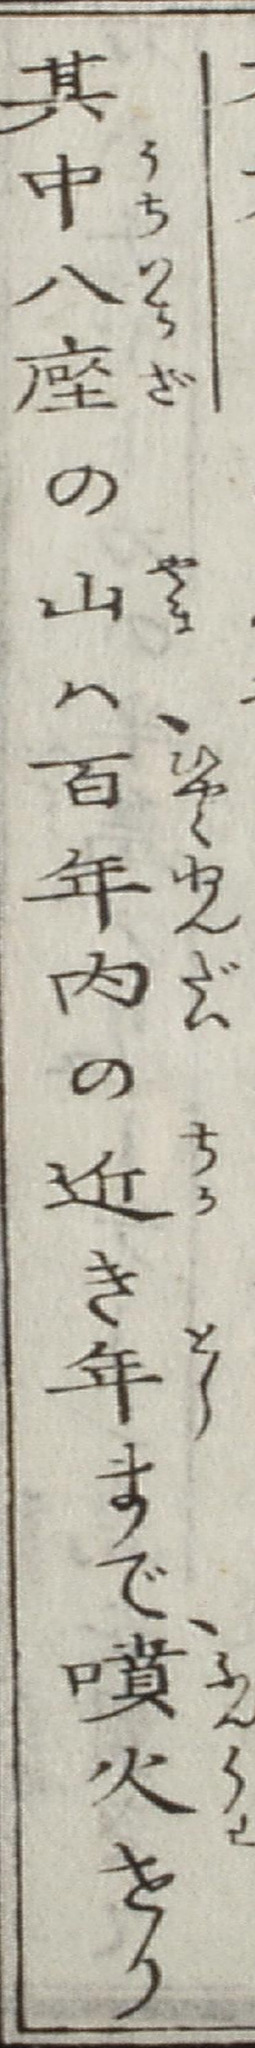其中八座の山は、百年内の近き年まで、噴火せり
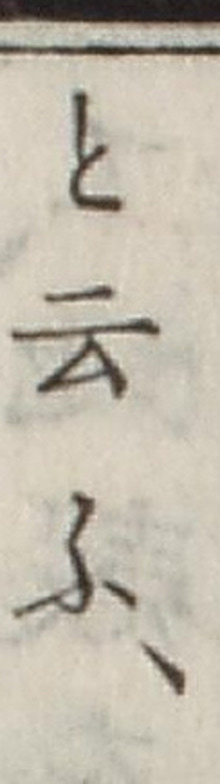と云ふ、
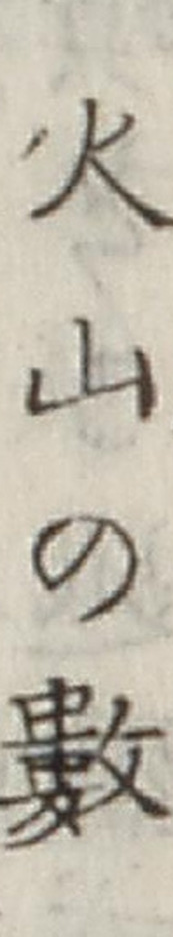火山の数
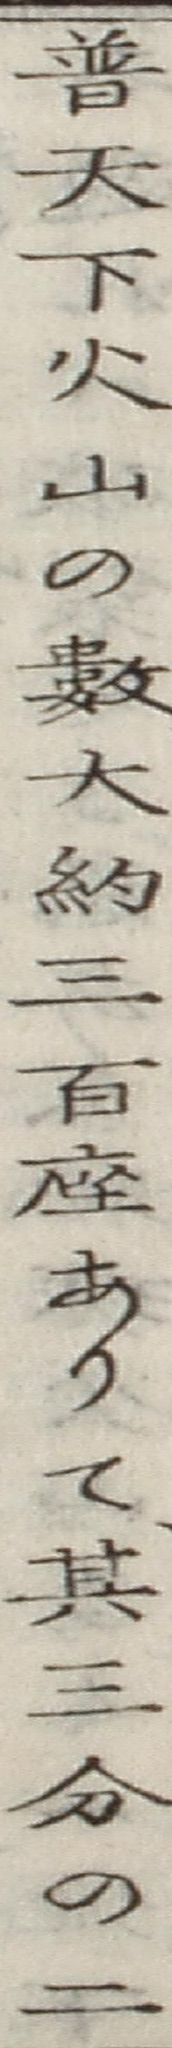普天下火山の数、大約三百座ありて、其三分の二
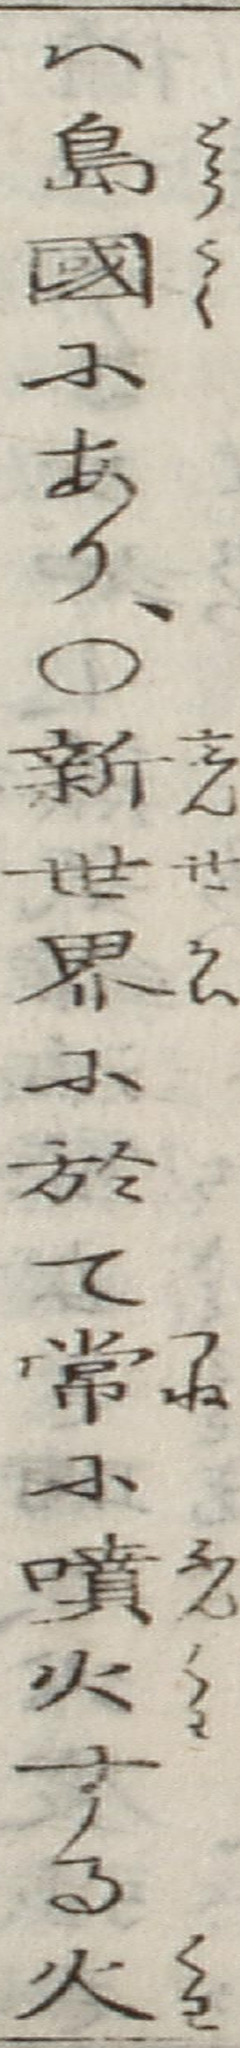は島国にあり、◯新世界に於て常に噴火する火
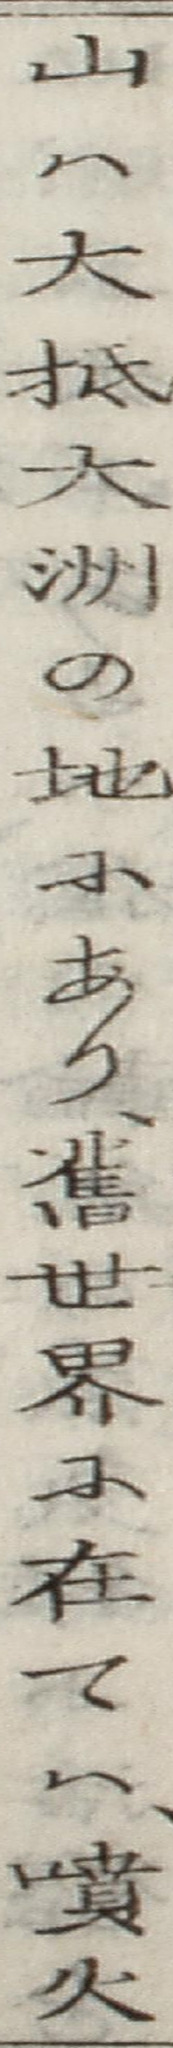山は大抵大洲の地にあり、旧世界に在ては、噴火
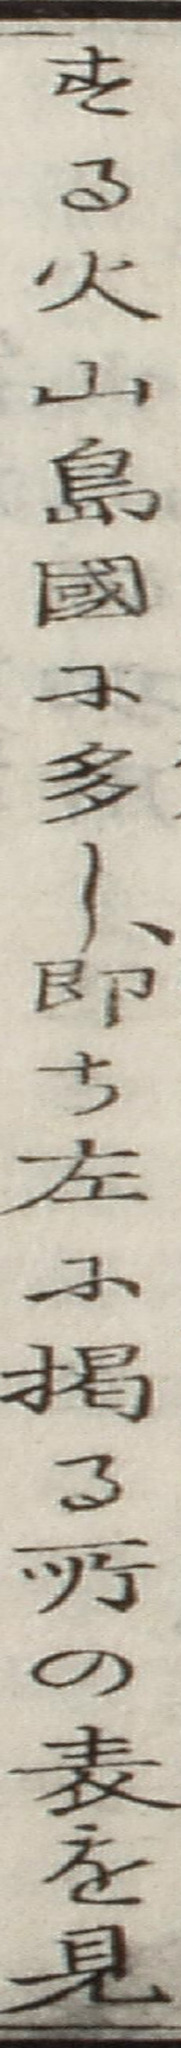する火山島国に多し、即ち左に掲る所の表を見
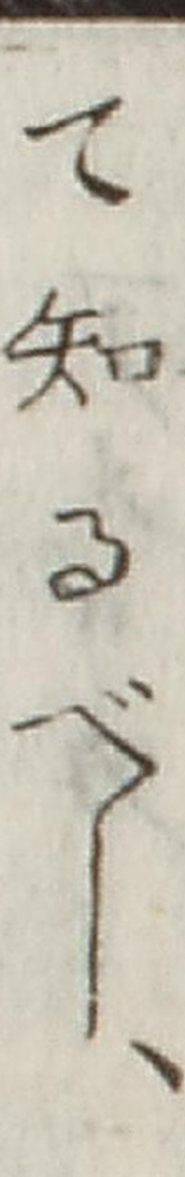て知るべし、
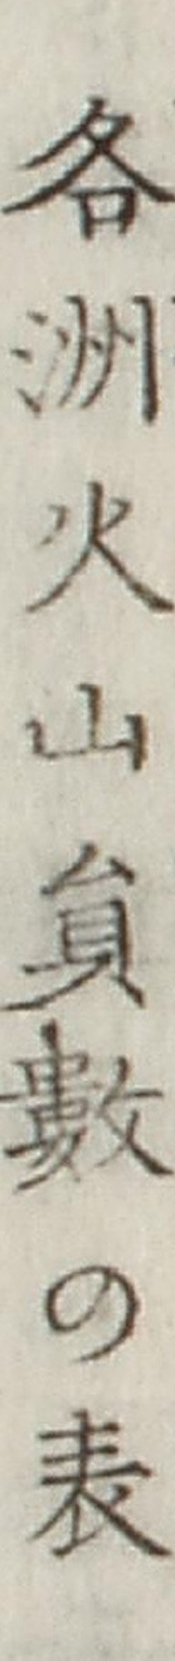各洲火山員数の表
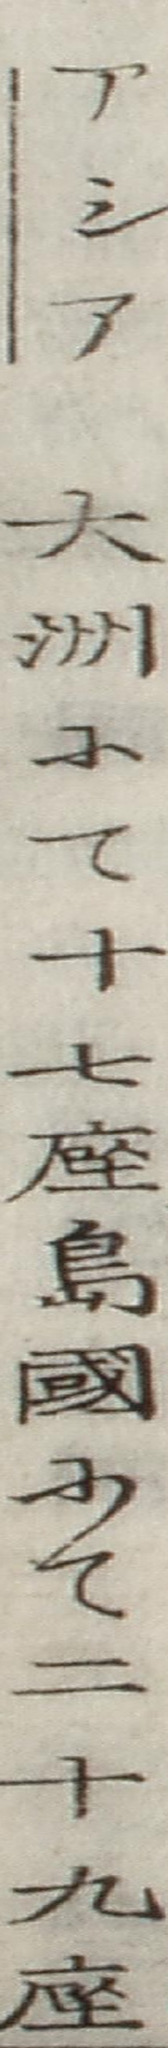アシア大洲にて十七座、島国にて二十九座

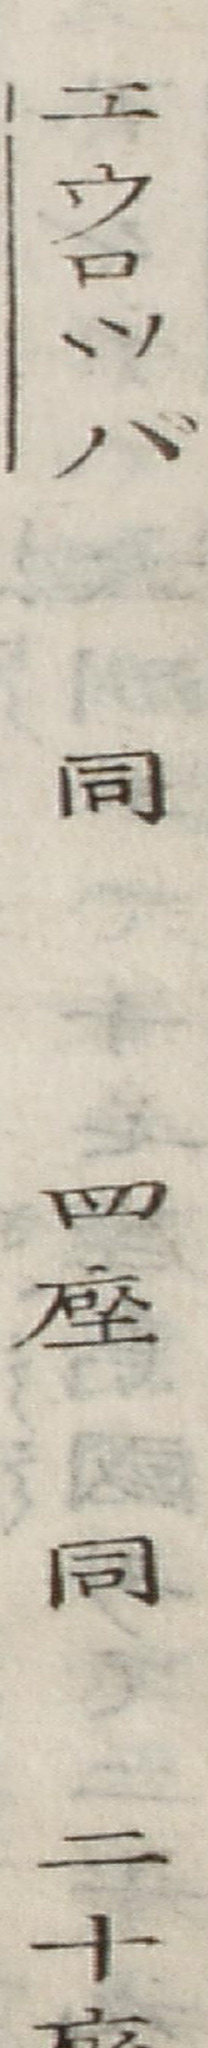エウロツパ同四座同二十座
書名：訓蒙　天然地理學　上
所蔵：東京大学地震研究所図書室 Earthquake Research Institute Library, The University of Tokyo, JAPAN
